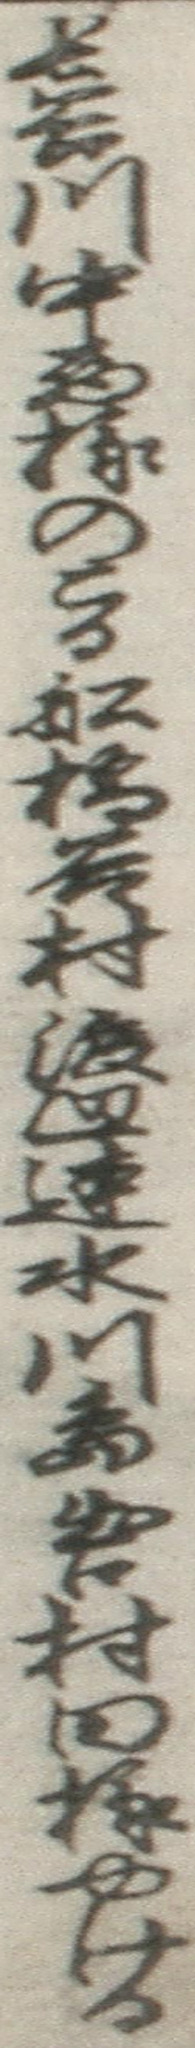長谷川中西様のこる船橋谷村渡辺速水川島出口村田様やける

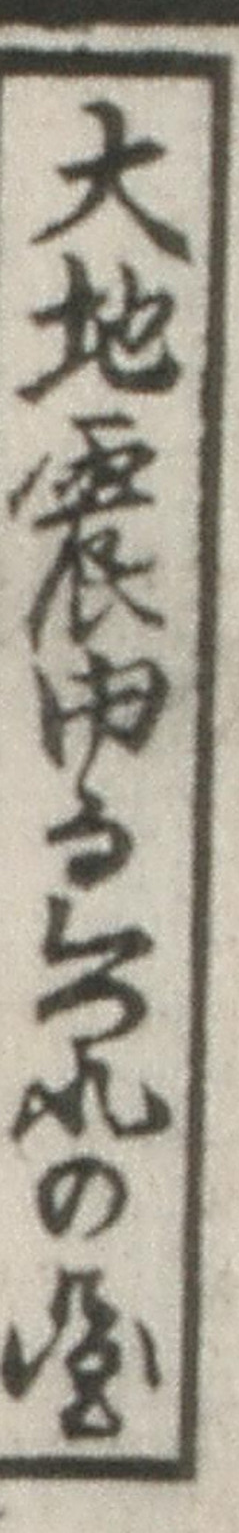大地震由るくつれの図

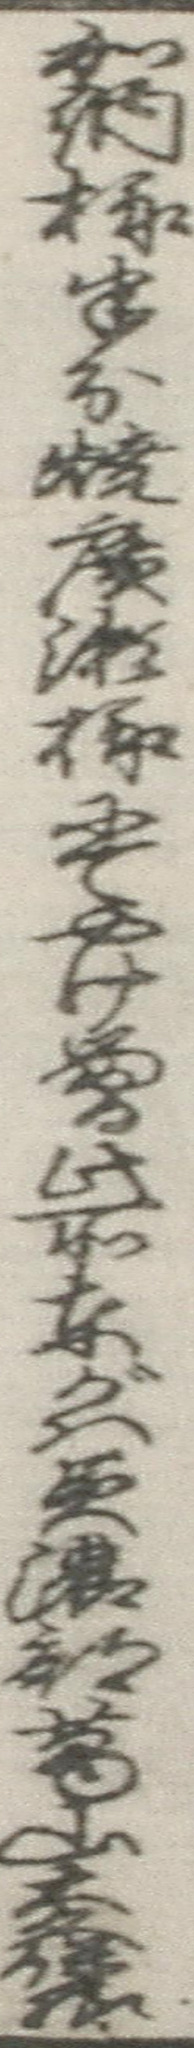加納様半分焼広瀬様にてやけ留る此所東がハ美濃部葛山大久保様
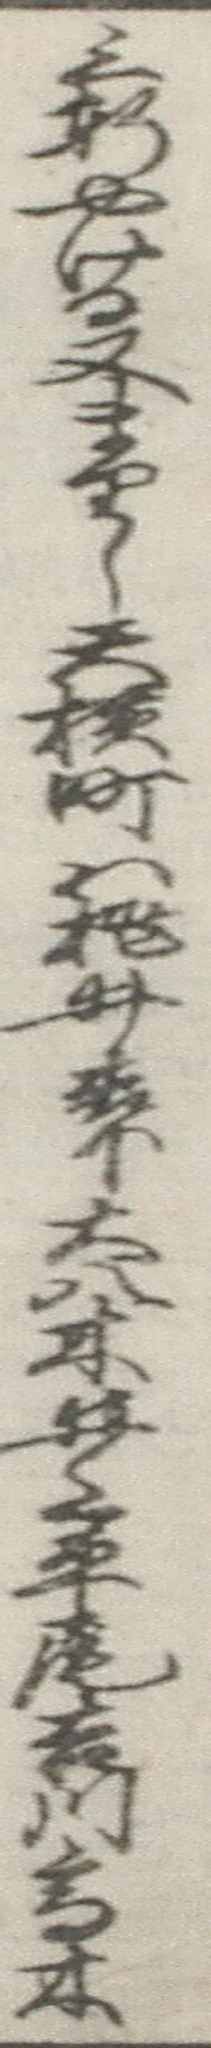三軒やける又まりし天横町ハ桃井森下大八木井上平尾吉川高木
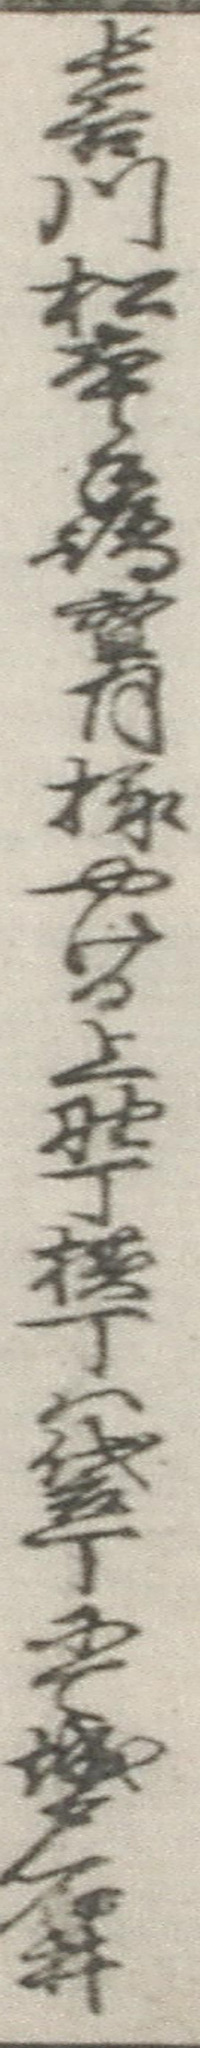長谷川松本手島望月様やける上野丁横丁ハ袋丁にて城戸石井
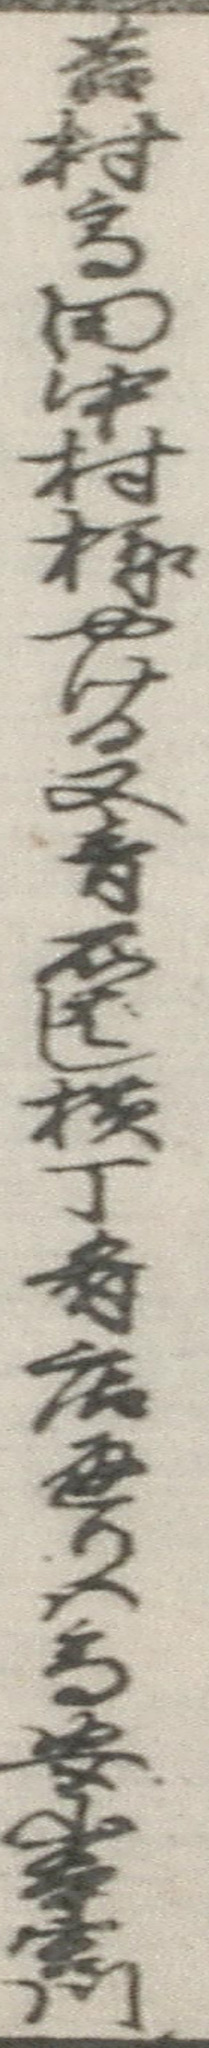吉村高田中村様やける又青石ばし横丁肴店通りハ高安山本宮川
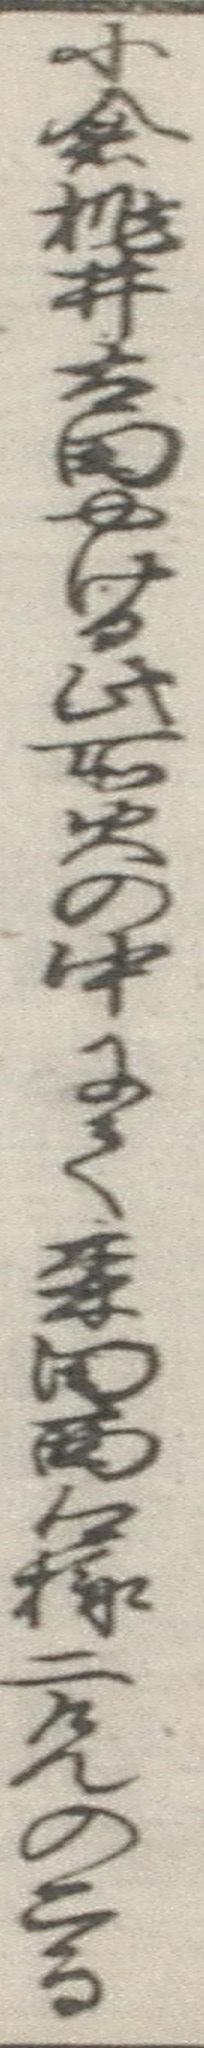小倉桃井太田やける此所火の中にて森田西郷様二けんのこる
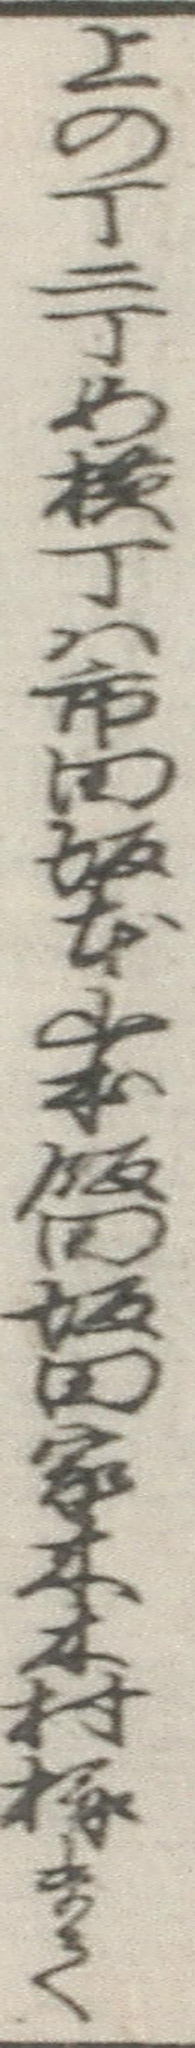上の丁二丁め横丁ハ市田坂本山本飯田坂田家木木村様まて
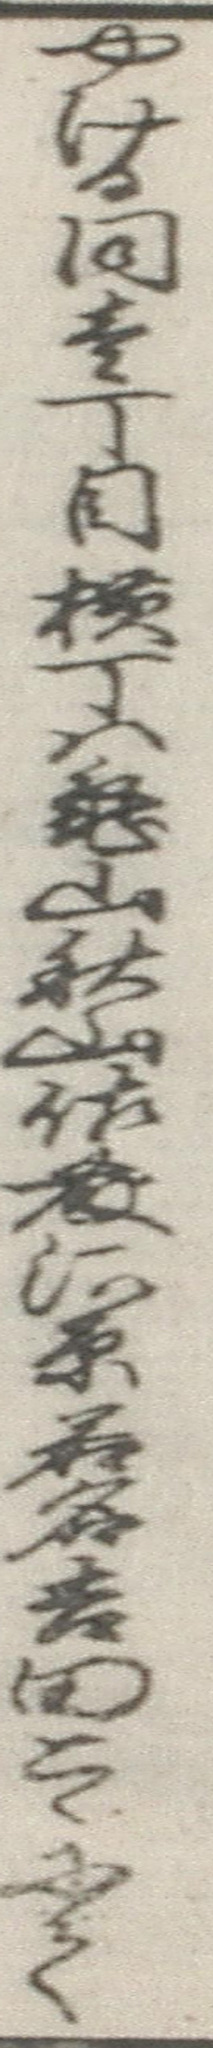やける同壱丁目横丁ハ亀山秋山佐藤河原桑名吉田こゝにて
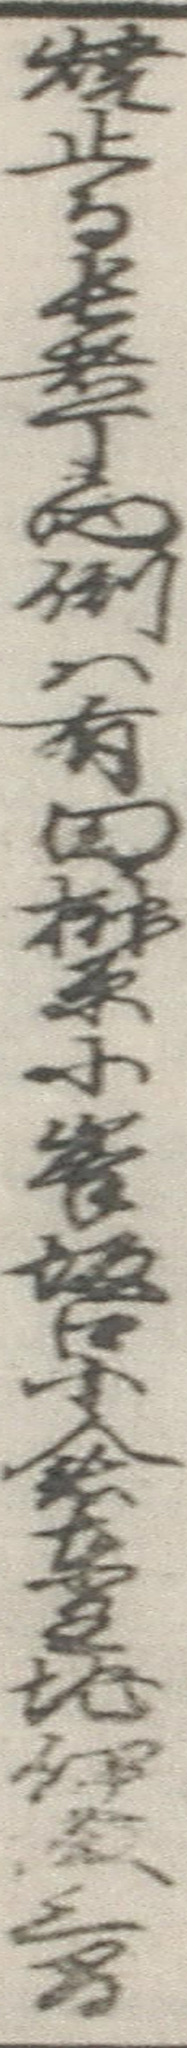焼止る長者丁向側ハ有田榊原小峯坂口小倉東王地伊藤三間
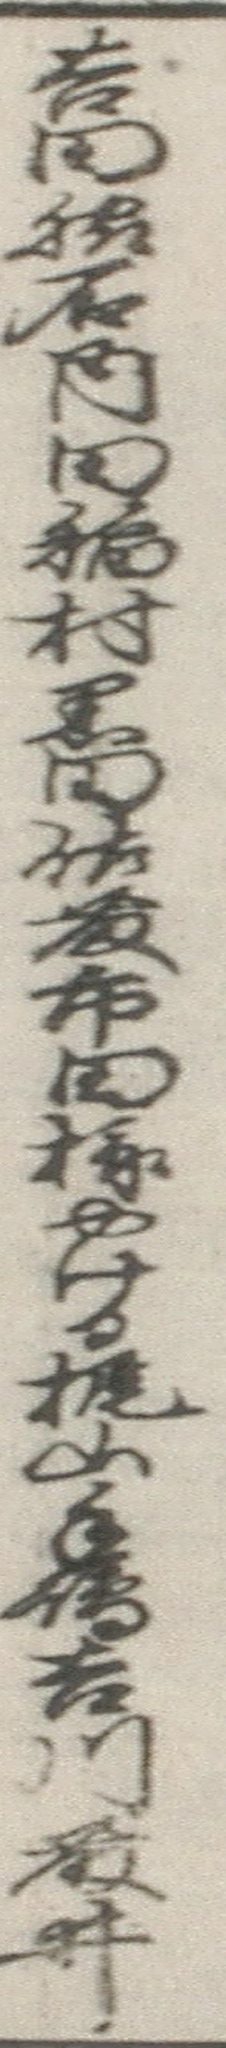吉田脇石内田稲村黒田佐藤市田様やける梶山手島吉川藤井
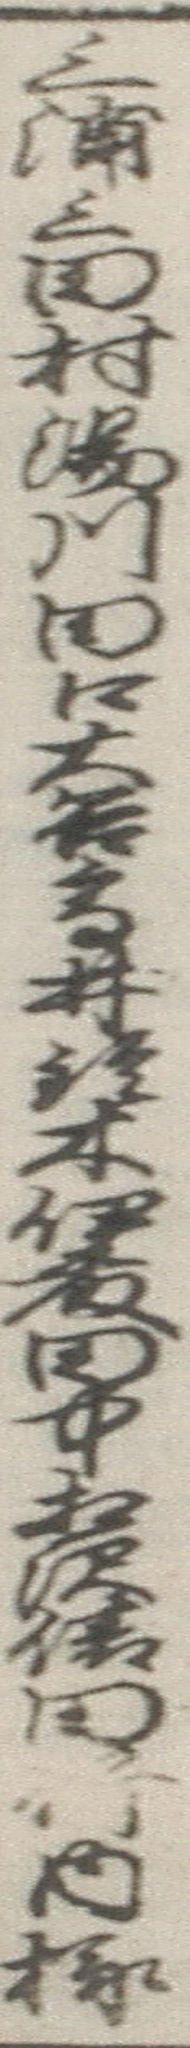三浦三田村湯川田口大谷高井鈴木伊藤田中相沢俵田行内様
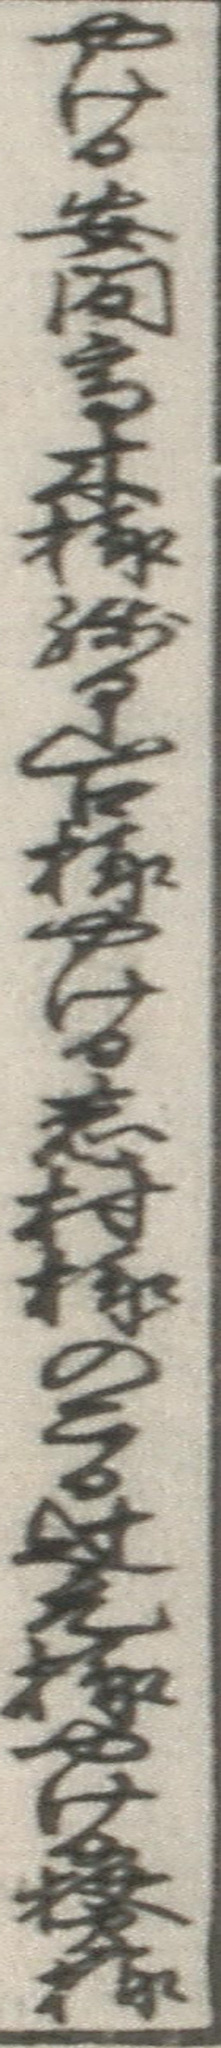やける安間高木様残る山口様やける志村様のこる辻元様やける狭間様
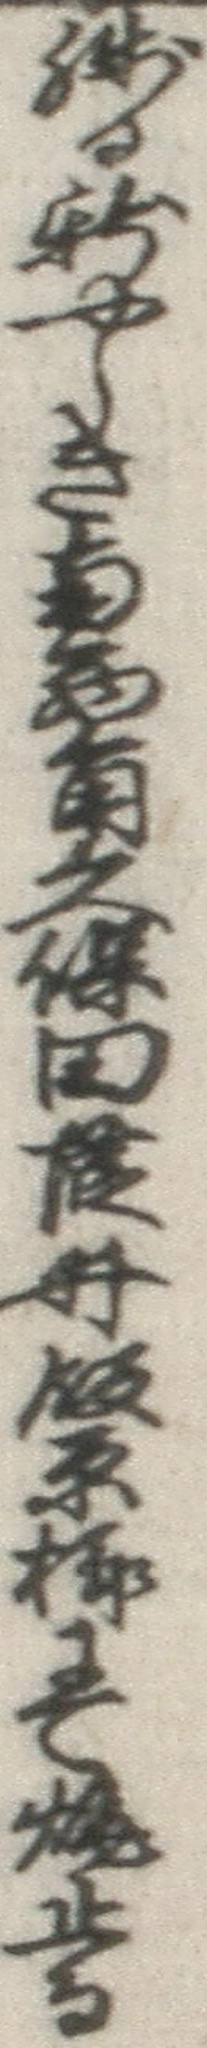残る新やしき南西角久保田藤井飯原様にて焼止る
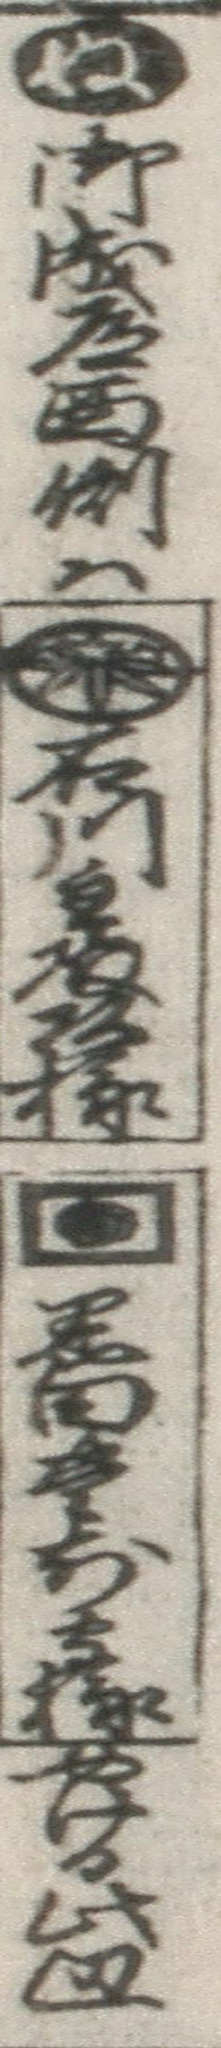ぬ御成道西側ハ石川主殿頭様黒田豊前守様やける此辺
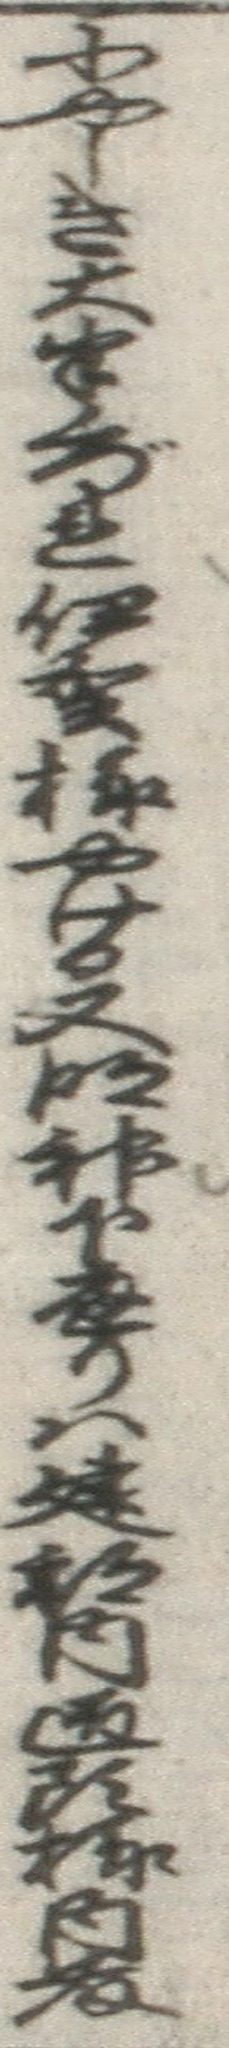小やしき大半くづれ伊賀様やける又明神下通りハ建部内匠頭様内藤
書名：大地震焼場細見記
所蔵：東京大学地震研究所図書室 Earthquake Research Institute Library, The University of Tokyo, JAPAN
